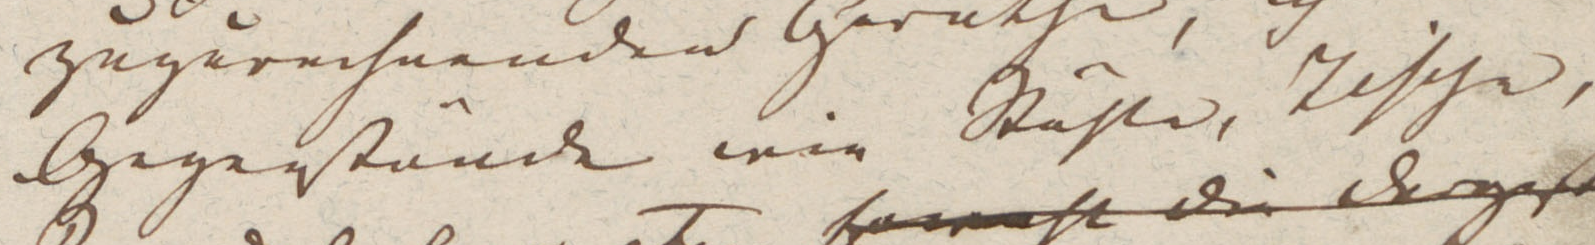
Gegenstände wie Stühle, Tische,
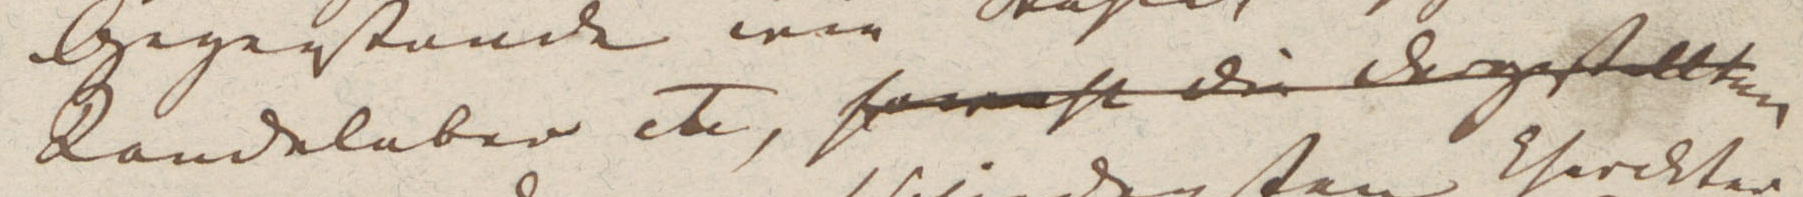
Kandelaber etc, sowohl die Dargestellten
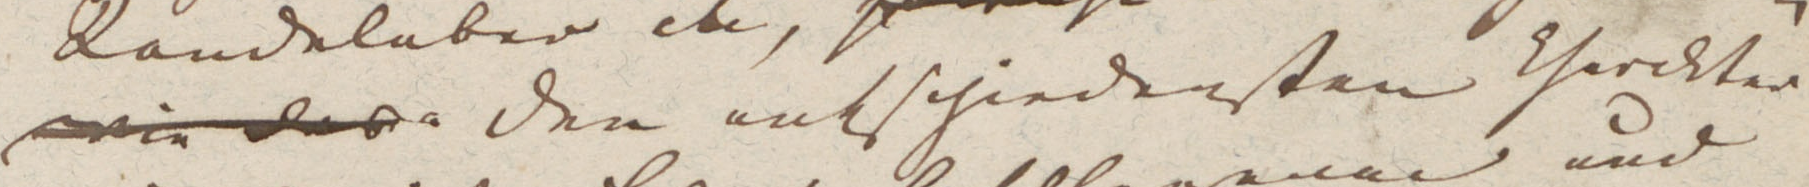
wie das den entschiedensten Charakter
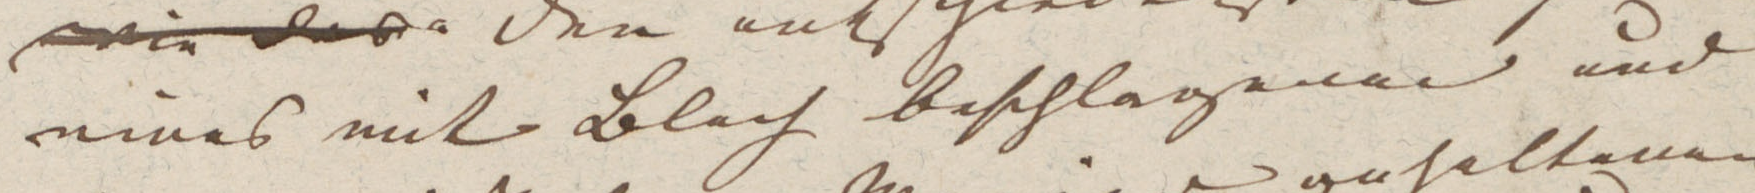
eines mit Blech beschlagenen und
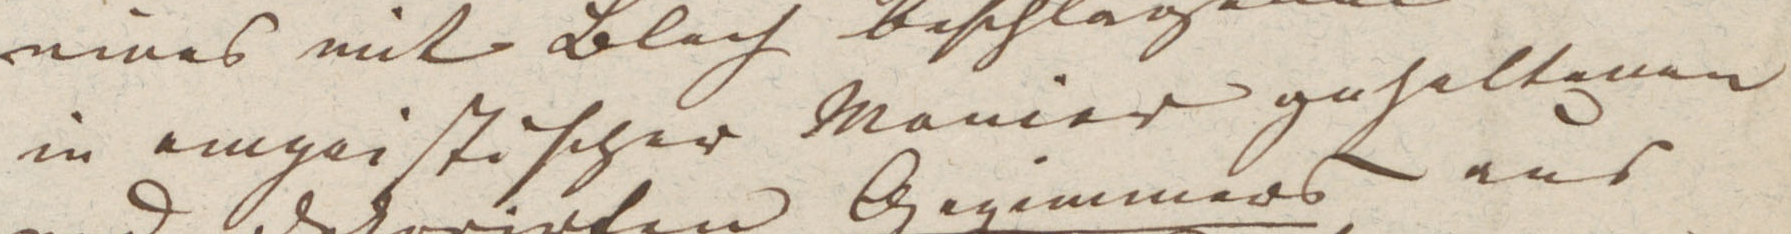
in empaistischer Manier gehaltenen
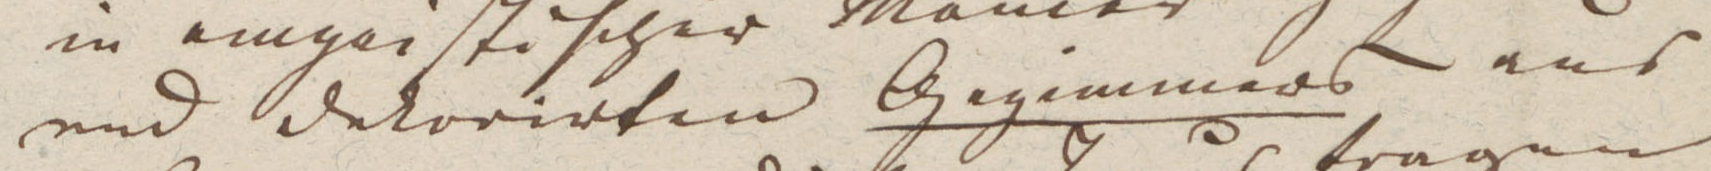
und dekorirten Gezimmers aus
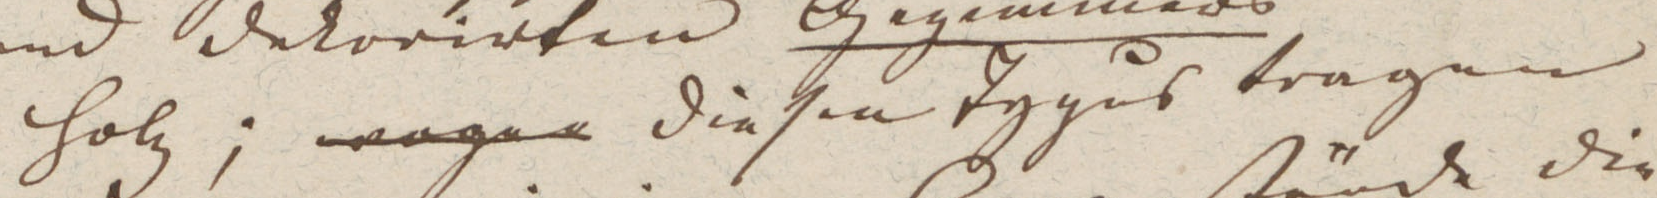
Holz; wegen diesen Typus tragen
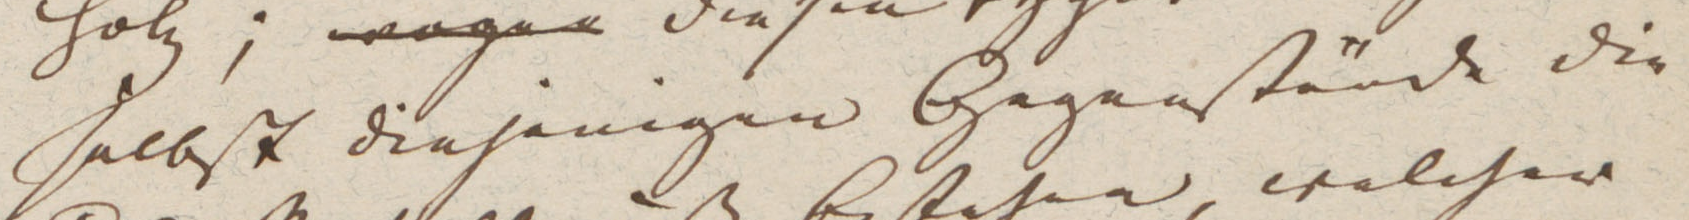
selbst diejenigen Gegenstände die
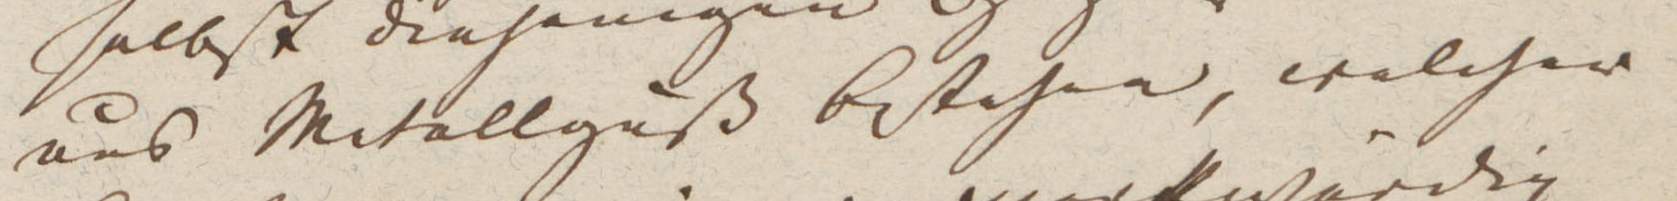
aus Metallguss bestehen, welcher
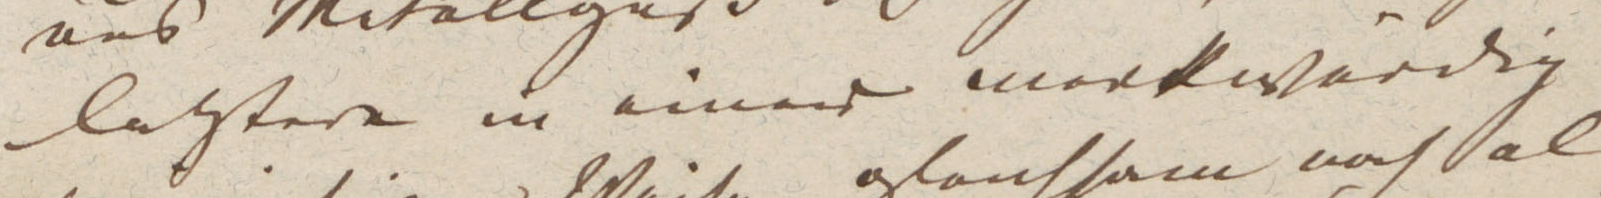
letztere in einer merkwürdig
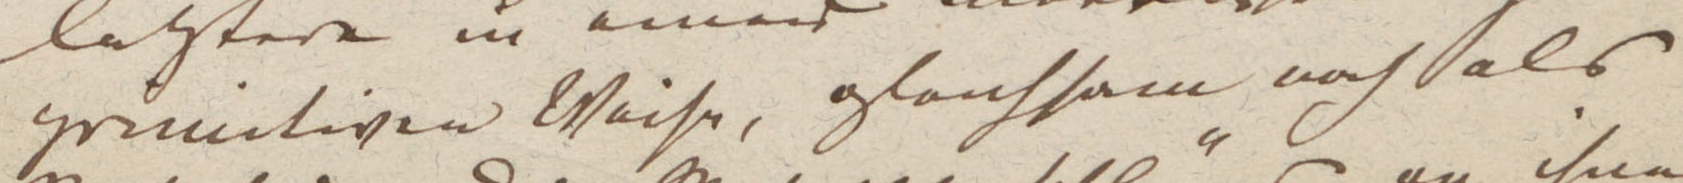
primitiven Weise, gleichsam noch als
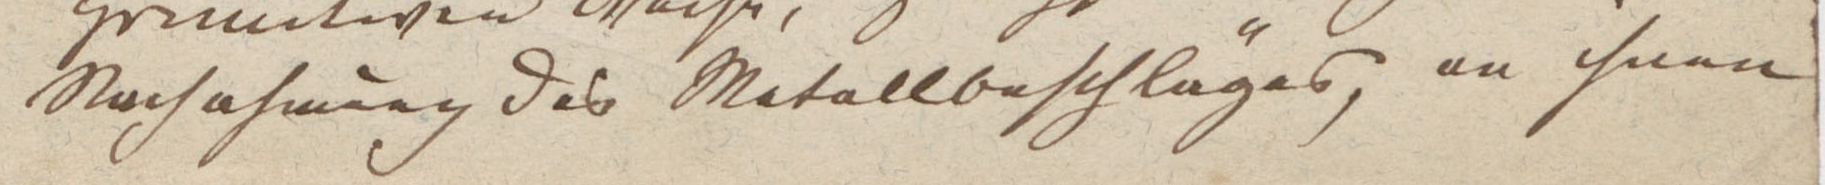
Nachahmung des Metallbeschläges, an ihnen
